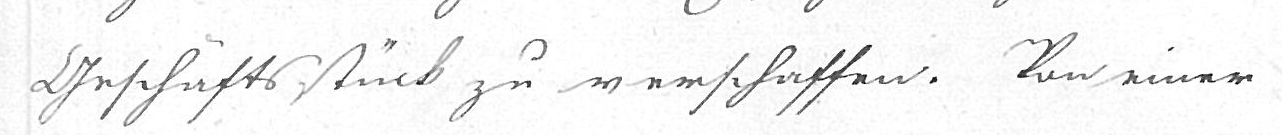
Geschätsstück zu verschaffen. Von einer
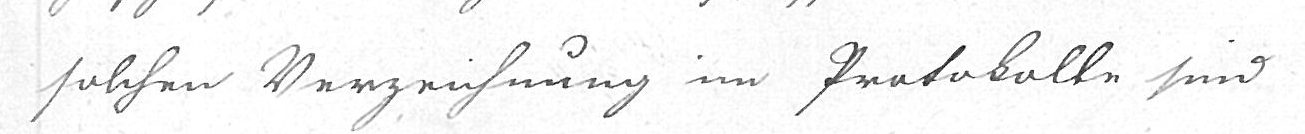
solchen Verzeichnung im Protokolle sind
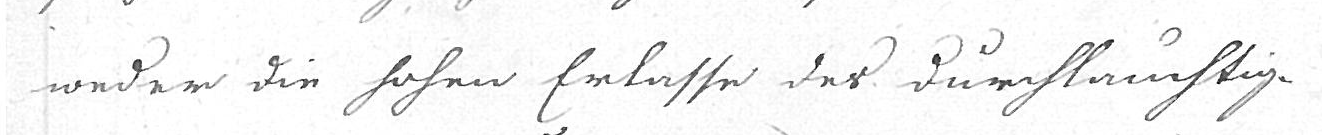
weder die hohen Erlasse des durchlauchtig-
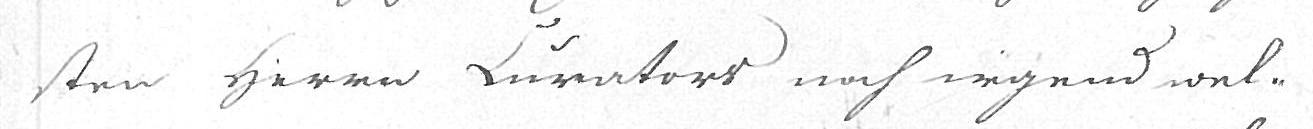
sten Herrn Curator noch irgend wel-
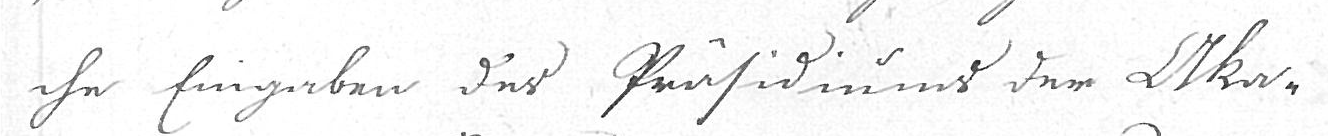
che Eingaben des Präsidiums der Aka-
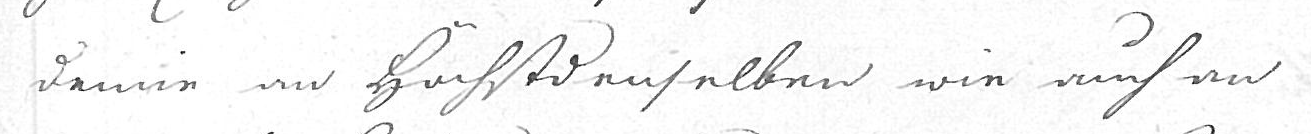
demie an Höchstdenselben wir auch an
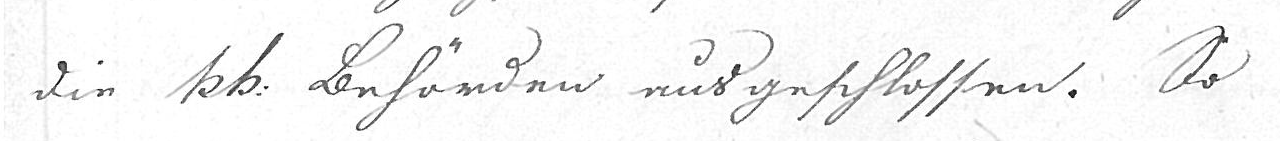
die kk. Behörden ausgeschlossen. So
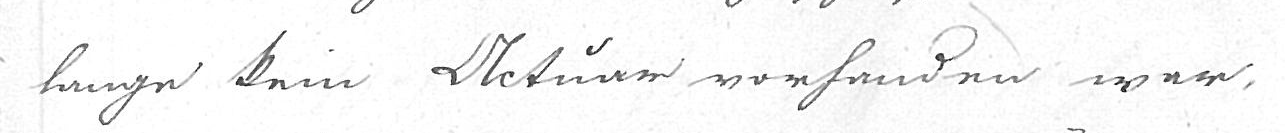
lange kein Actuar vorhanden war,
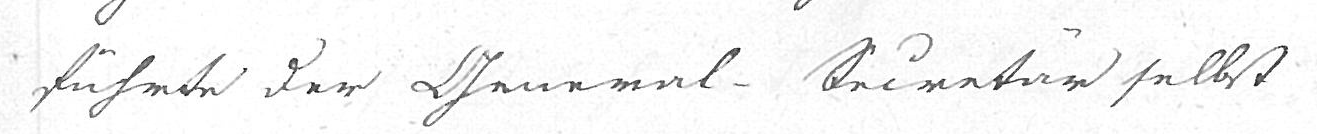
führte der General-Secretär selbst
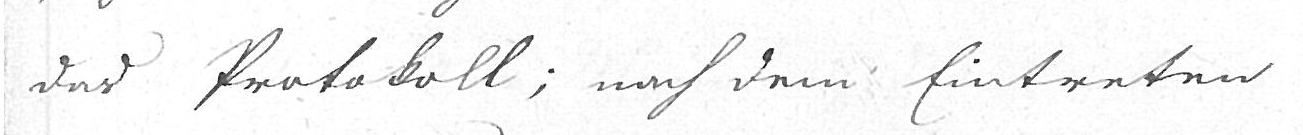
das Protokoll; nach dem Eintreten
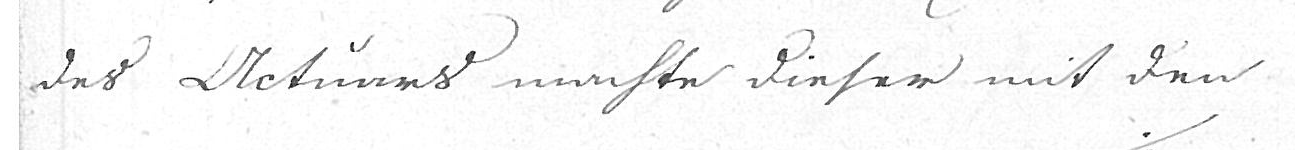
des Actuars machte dieser mit den
